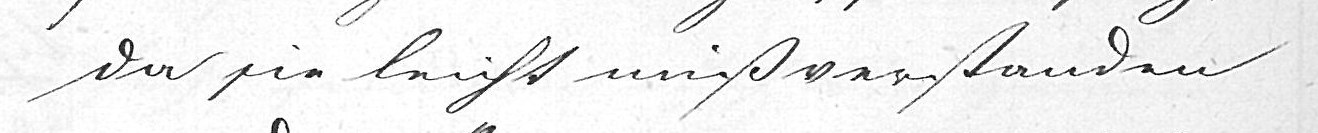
die sie leicht mißverstanden
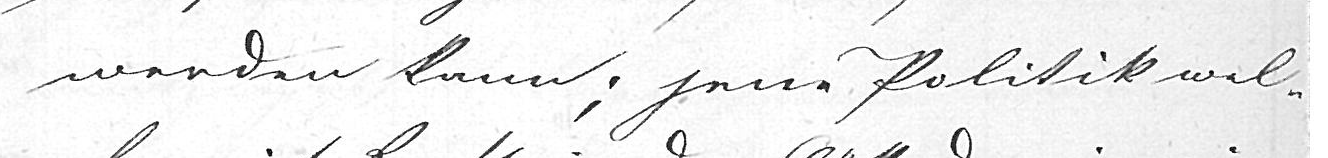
werden kann; jene Politik wel-
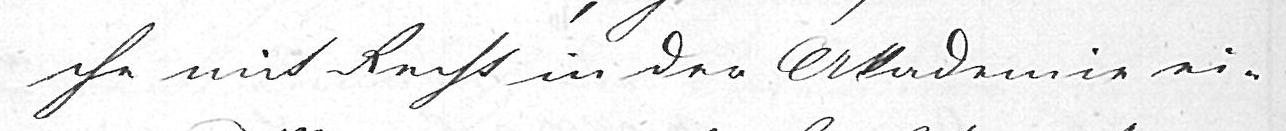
che mit Recht in der Akademie ei-
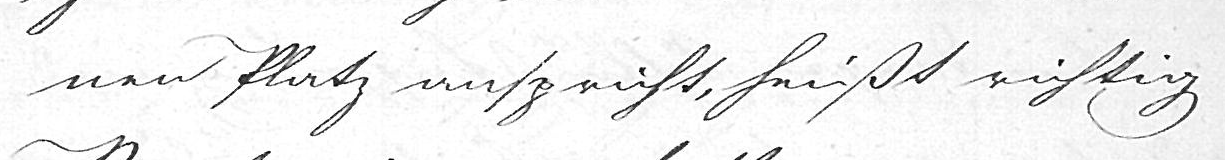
nen Platz anspricht, heißt richtig
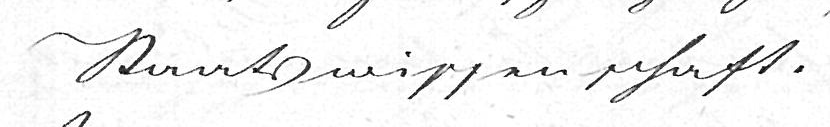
Staatswissenschaft.
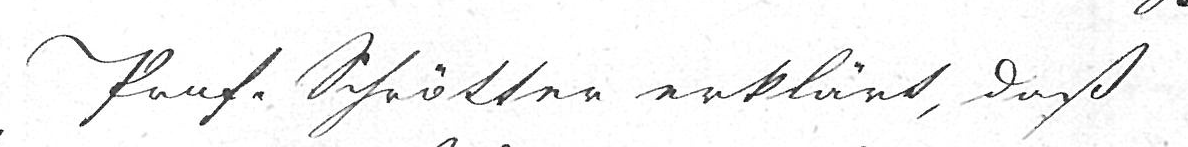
Prof Schrötter erklärt, daß
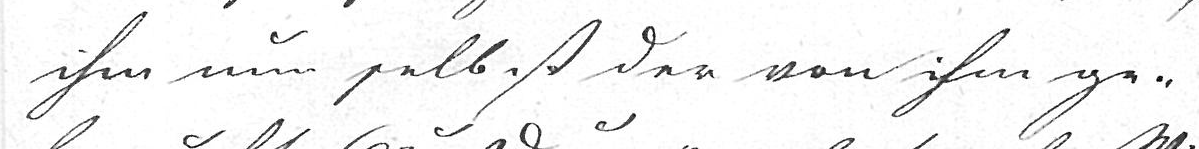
ihm nun selbst der von ihm ge-
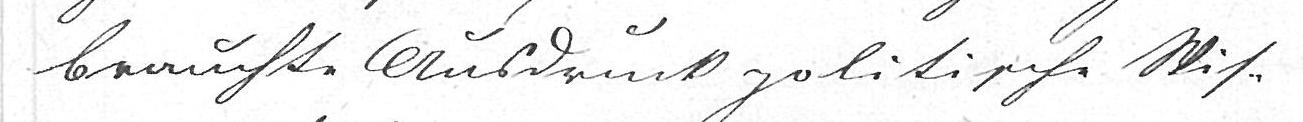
brauchte Ausdruck politische Wis-
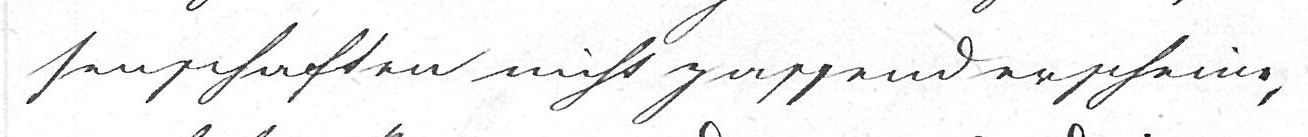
senschaften nicht passend erscheine,
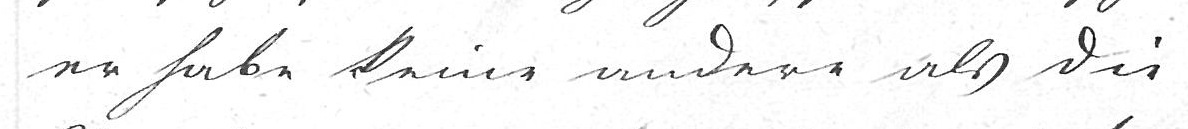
er habe keine andere als die
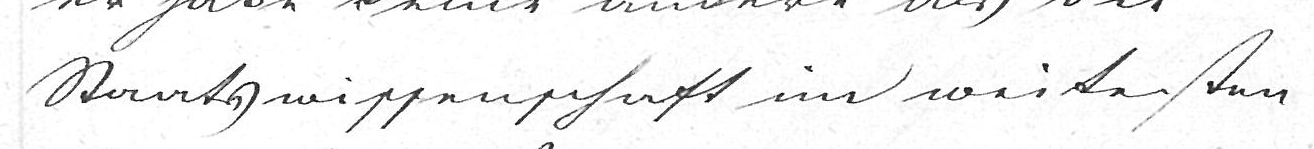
Staatwissenschaft im weitesten
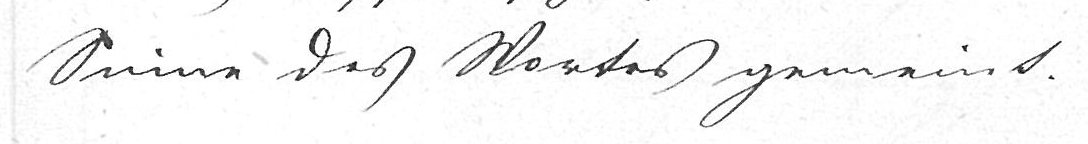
Sinne des Wortes gemeint.
